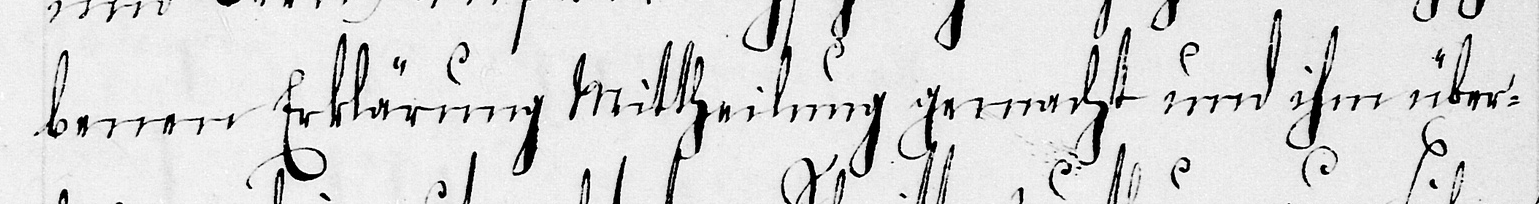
benen Erklärung Mittheilung gemacht und ihm über¬
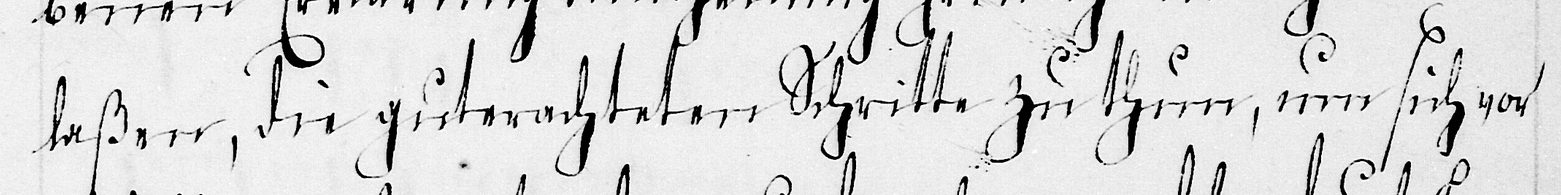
laßen, die guterachteten Schritte zu thun, um sich vor
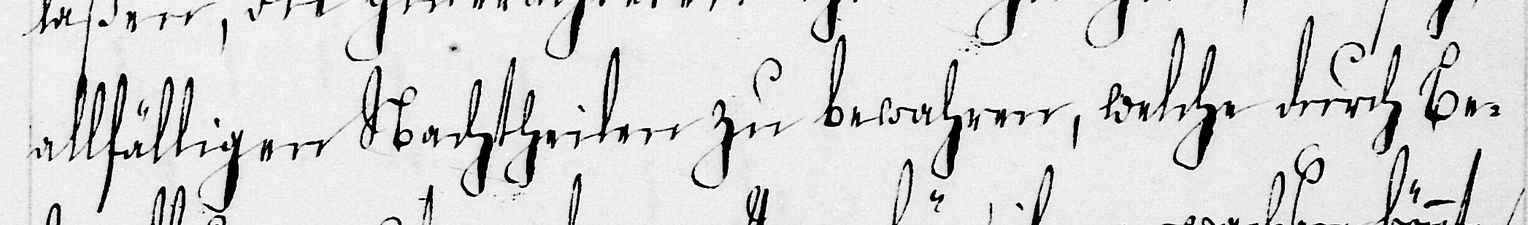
allfälligen Nachtheilen zu bewahren, welche durch Be¬
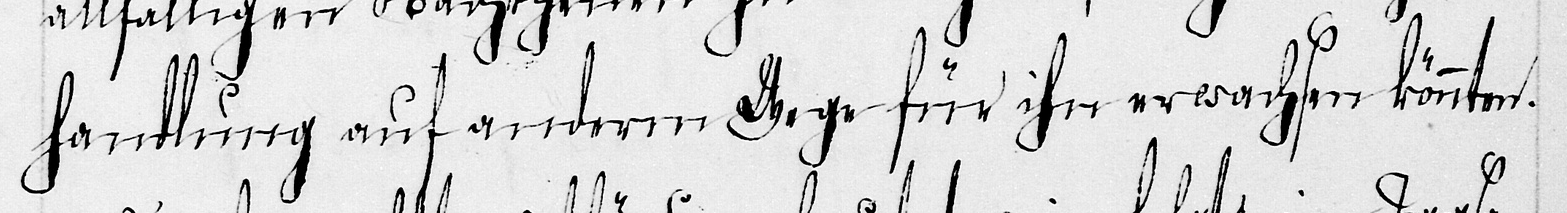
handlung auf anderm Wege für ihn erwachsen könnten.
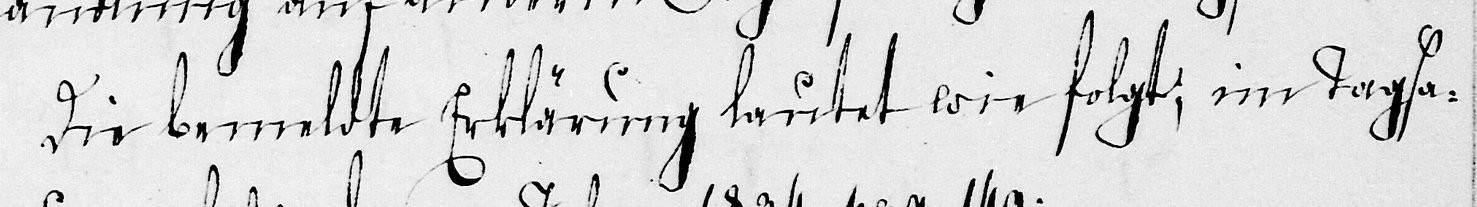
Die bemeldte Erklärung lautet wie folgt, im Tagsa¬
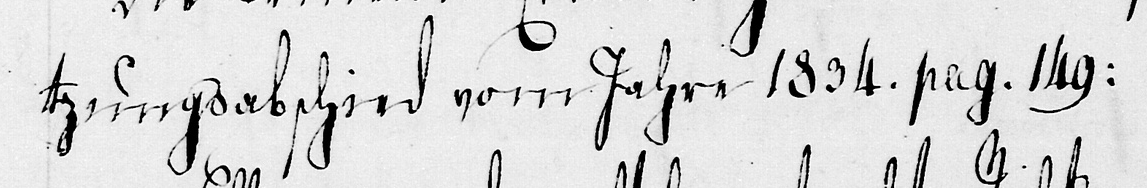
tzungsabschied vom Jahre 1834. pag. 149:
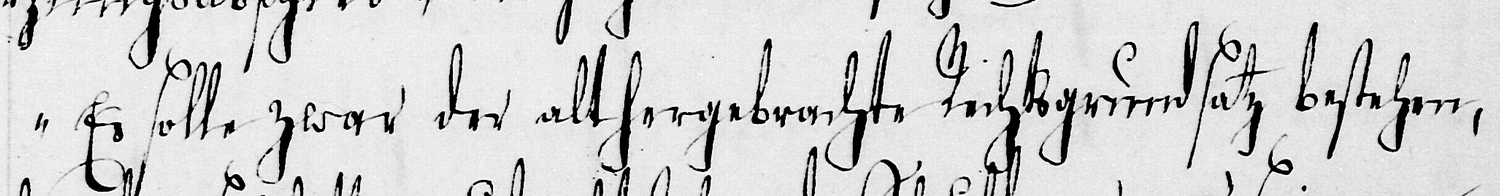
„Es solle zwar der althergebrachte Rechtsgrundsatz bestehen,
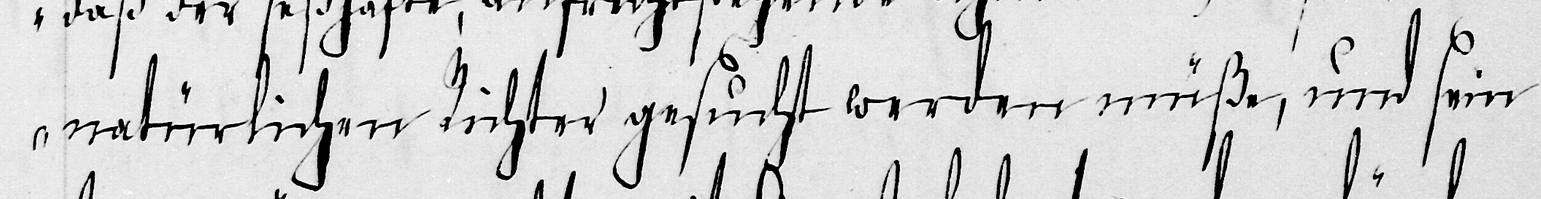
natürlichen Richter gesucht werden müße, und sein
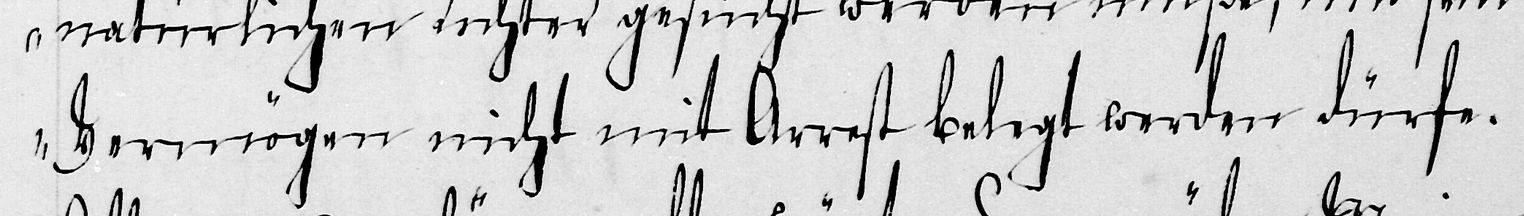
Vermögen nicht mit Arrest belegt werden dürfe.
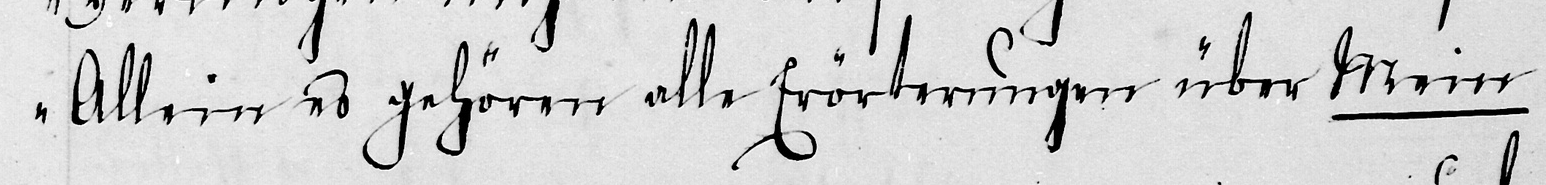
Allein es gehören alle Erörterungen über Mein
